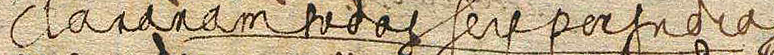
clararam todas seis per judias
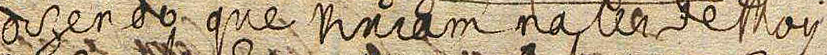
dizendo que viuiam na lei de Moy
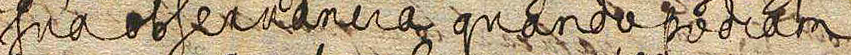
sua obseruancia quando podiam
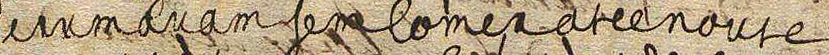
jeiumauam sem Comer atee noute
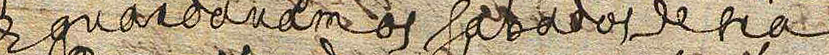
E guardauam os sabados de tra
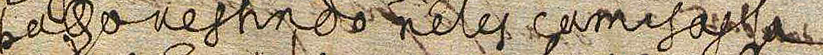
balho uestindo neles camisas la
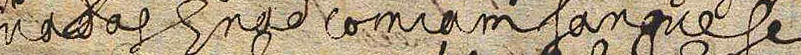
uadas E naõ comiam sangue se
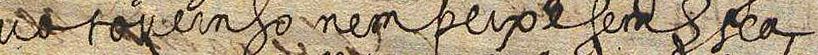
uo toucinho nem peixe sem Esca
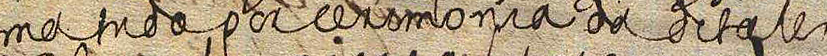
ma tudo por cerimonia da dita lei
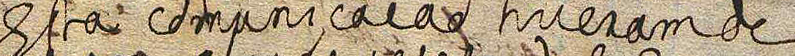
E Esta cōmunicacaõ tiueram de
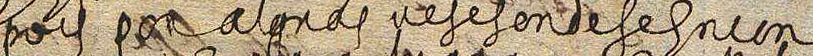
pois por alguās ueses onde se Encon
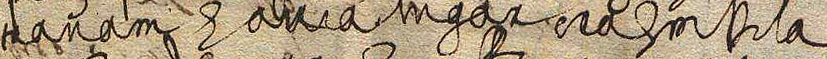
trauam E auia lugar ora Em Vila
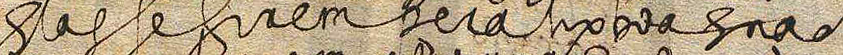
Elas se hirem pera lixboa E naõ
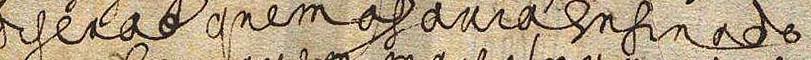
diseraõ quem a hauia Ensinado
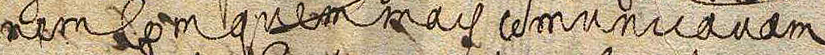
nem Com quem mais cōmunicauam
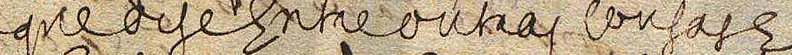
o que dise Entre outras cousas E
